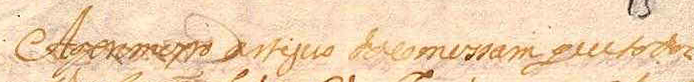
Ao primeyro artiguo da comissam que todos
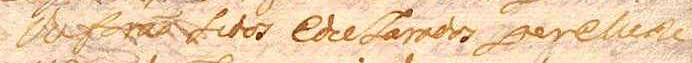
lhe foraõ Lidos e decLarados por elle Re
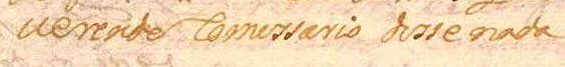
uerendo comissario disse nada
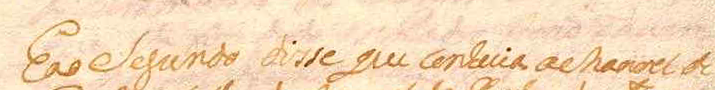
E ao Segundo disse que conhecia a Manoel de
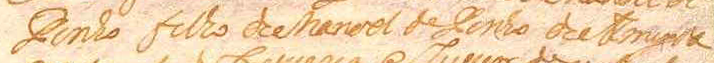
Pinho filho de Manoel de Pinho de Almeyda
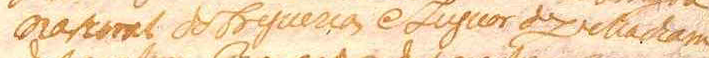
natural da freguezia e Luguar de villa cham
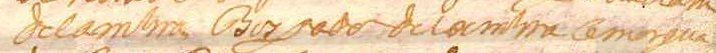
de Cambra Bispado de Coimbra Comarqua
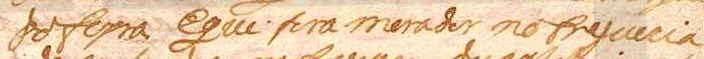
da feyra e que fora morador no freguezia
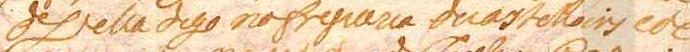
de Vella digo na freguezia de castelloins e de
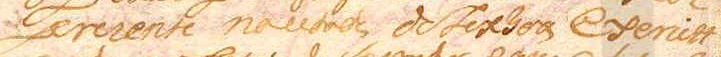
prezente na cidade de Lixboa exercitt
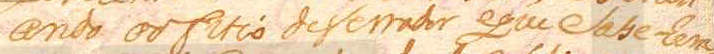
ando o ofisio de ferrador e que Sabe hera
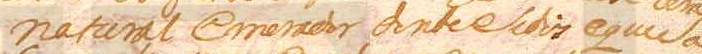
natural e morador donde Se dis e que Sa
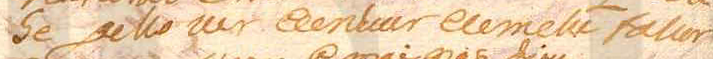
be pello uer conhecer e com elle fallar
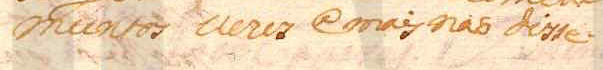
muntas uezes e mais naõ disse.
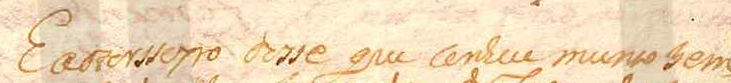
E ao tersseyo disse que conhece munto bem
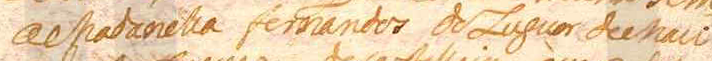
a Madanella fernandes do Luguar de Maci
